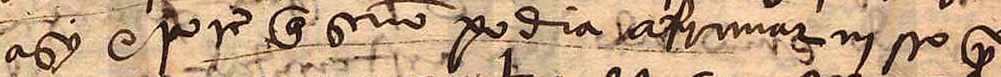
asy e porē q̄ se nō podia afyrmar njsso p̄o
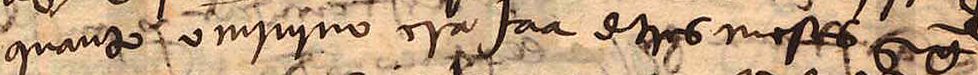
quanto o mjnjno era Jaa de tres meses segdo
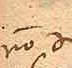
nō se
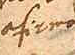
afirma
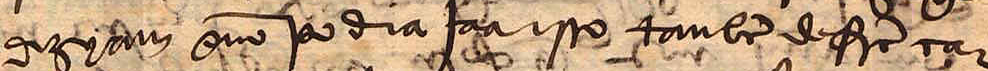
dizyam e n̄o podia Jaa isso tanbē defrēcar
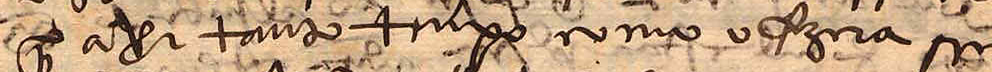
p̄o aꝟr tanto tenpo como o fezera sse
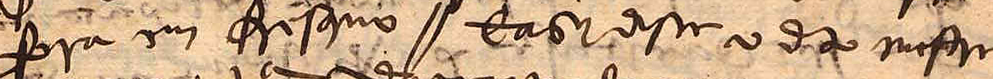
fora em fresquo // E asy disse o dto mestre
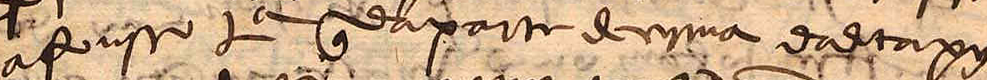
afonsso ta q̄ da parte de cyma da dita py
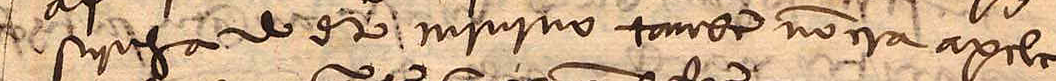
synha do dto mjnjno tanbē nō era a pele
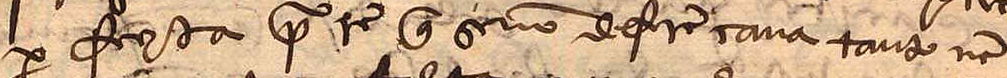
ꝑfeyta p̄orē q̄ se nō defrēcaua tanto nē
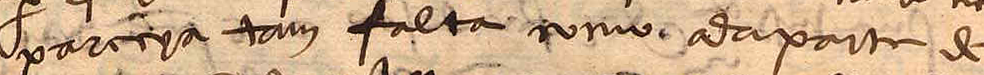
parecya tam falta como a da parte de
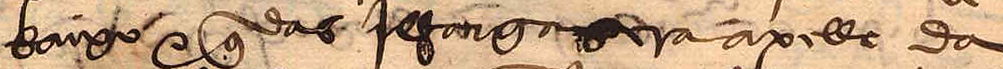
baixo e q̄ das Jlhargas era a pelle da
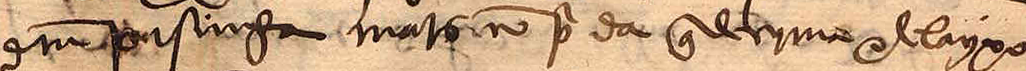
dt̄a pysynha majs c̄opida q̄ de cyma e de bayxo
